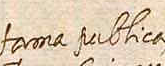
fama publica
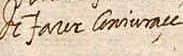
de Fazer coniuraçaõ
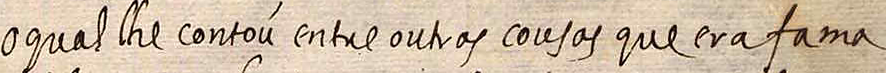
O qual lhe contoū entre outras cousas que era fama
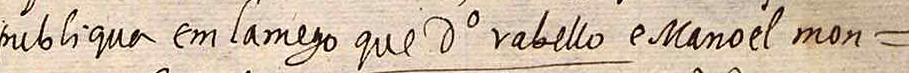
publiqua em lamego que Do rabello e Manoel mon
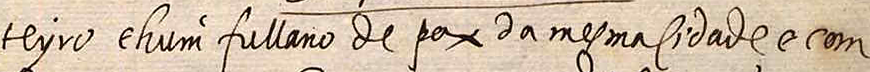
teyro e hum fullano de pax da mesma Cidade e com
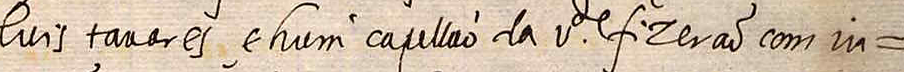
luis tauares, e hum capellaõ da v.de fizeraõ comiu
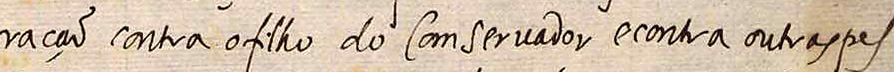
raçaõ contra o filho do Comseruador e contra outras pes
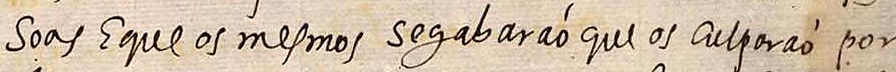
Soas E que os mesmos se gabaraõ que os culparaõ por
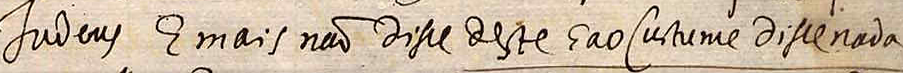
Judeus E mais naõ disse deste E ao Custume disse nada
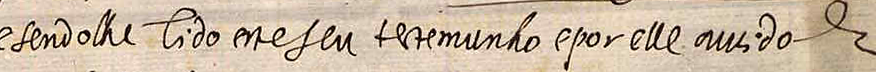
e sendolhe lido este seu testemunho e por elle ouuido E
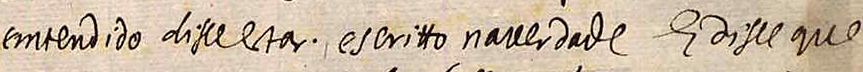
emtendido disse estar escritto na uerdade E disse que
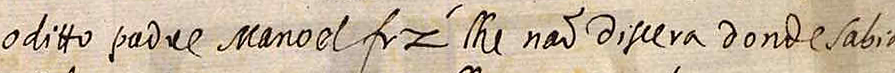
o ditto padre Manoel frz̄ lhe naõ dissera donde sabia
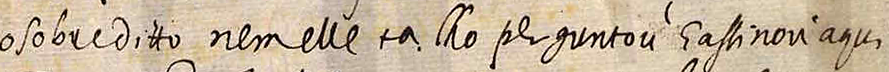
o sobreditto nem elle ta. lho perguntou E assinou aqui
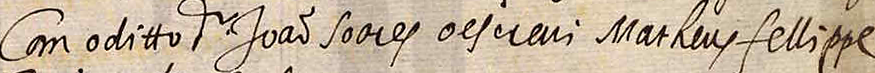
Com o ditto d.or Joaõ Soares o escreui Matheus fellippe
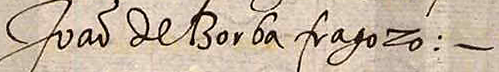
Joaõ de Borba fragozo:
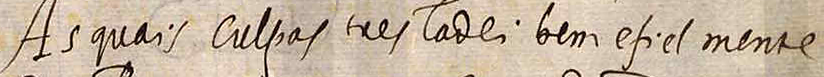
As quais culpas tresladei bem e fielmente
